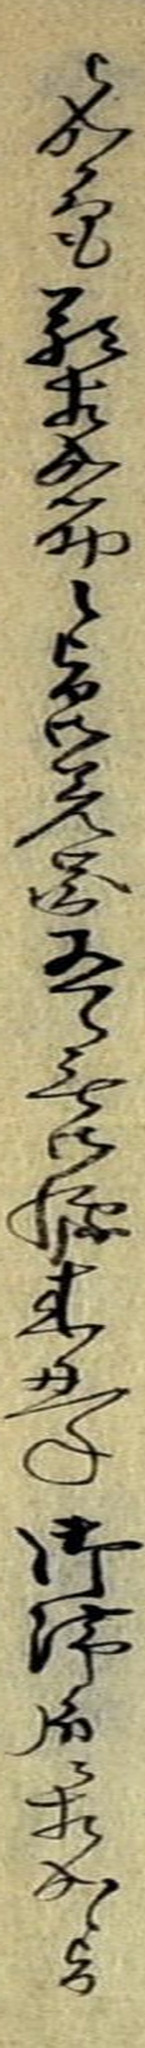被成候而も難相成筋之旨御差図有之無御拠来丑年御滞府ニ相成候旨
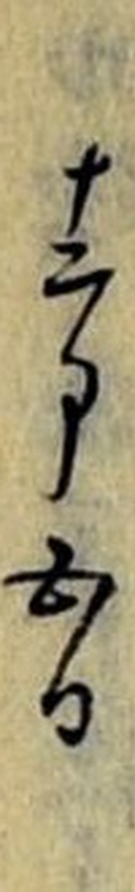十二月五日
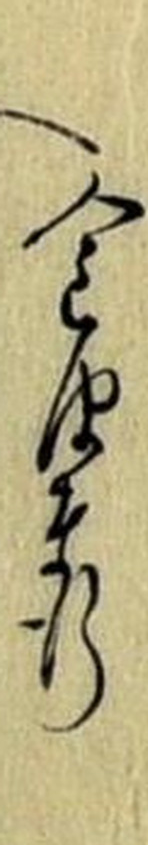金津奉行
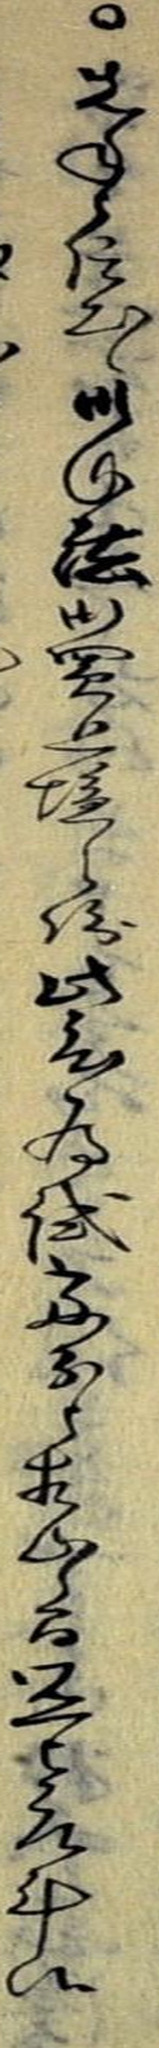○先年被仰出候御趣法御買上塩之儀此度為試当分被相止候間宜被取計候
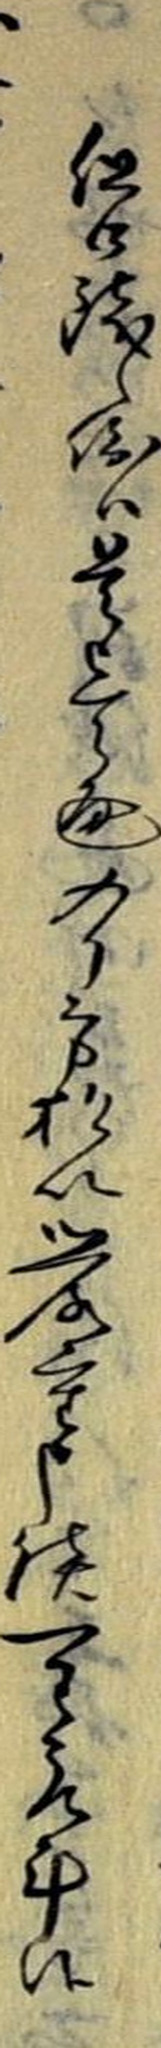但口銭之儀ハ是迄之通り〆り方猶以厳重申談可被取計候
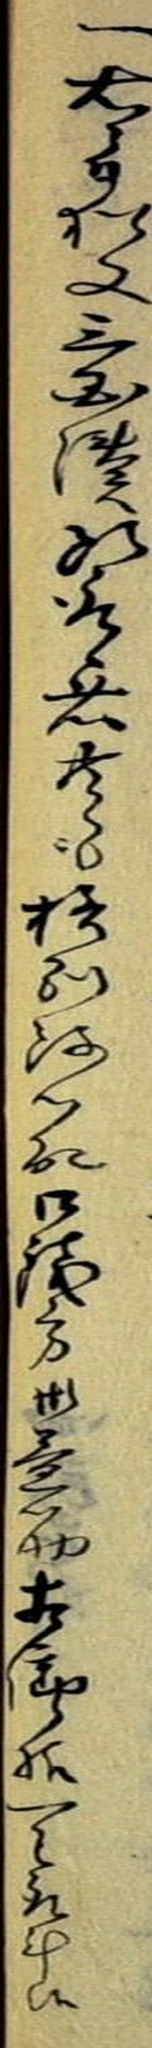一右ニ付猶又三国湊頭取候者共へも格別致心配口銭方御益筋相働候様可被取計候
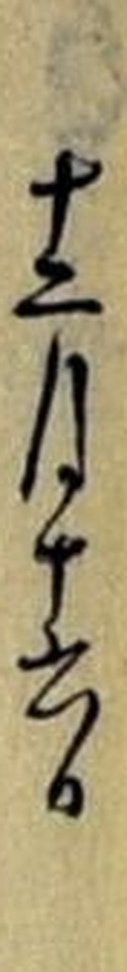十二月十六日
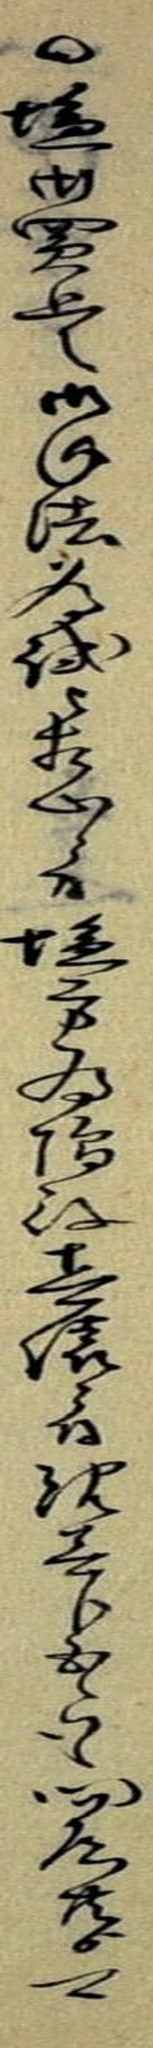○塩御買上之御趣法為試被相止ニ付塩方為増役壱俵ニ銀壱分五厘ツヽ問屋共ゟ可
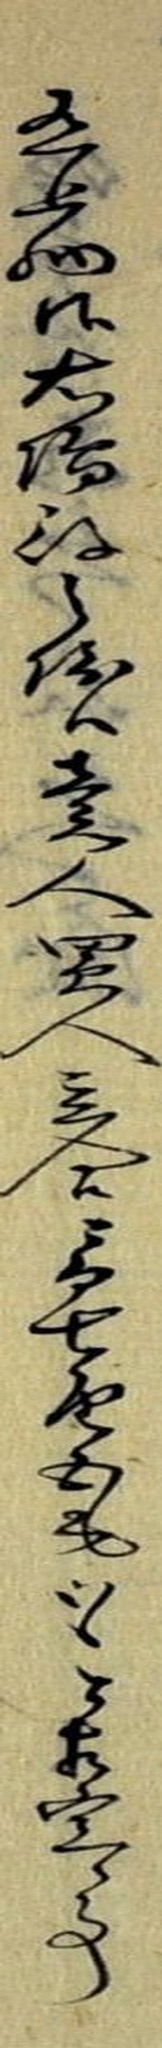有上納候右増役之儀ハ壱人買人立合ニ而七厘五毛ツヽと相定候事
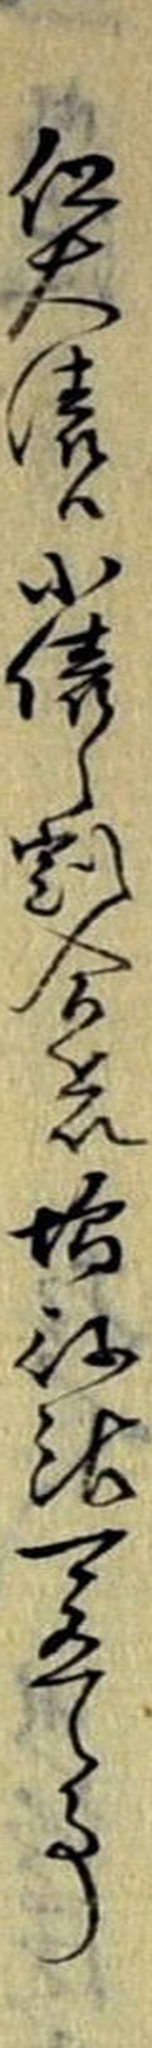但大俵ハ小俵之割合を以増役銀可有之事
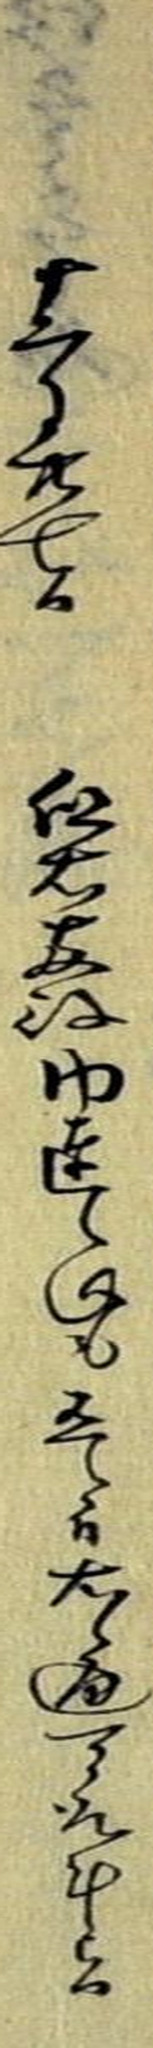十二月廿七日但右両役内達之趣も有之ニ付右之通可取
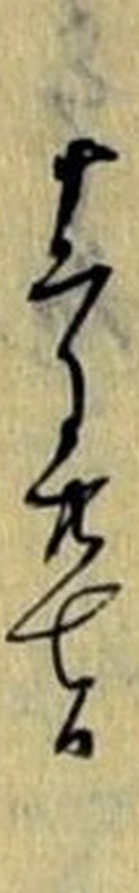十一月廿九日

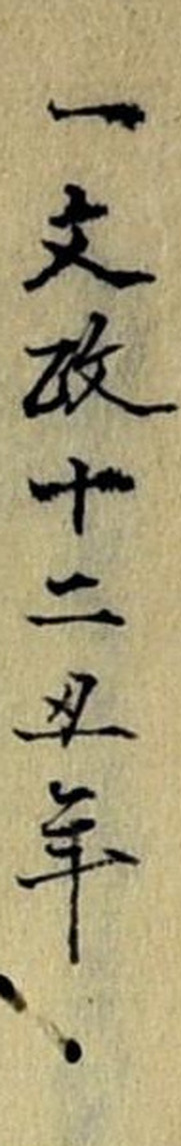一文政十二丑年
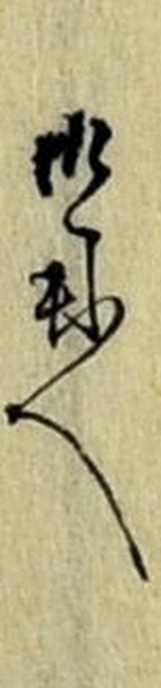御用人
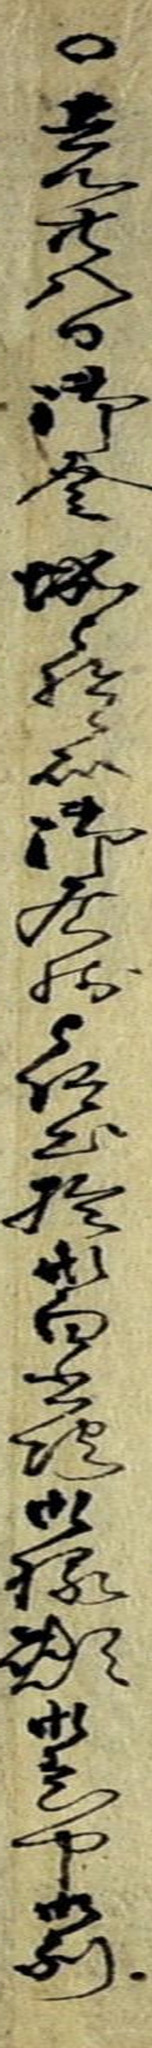○去ル廿八日御登城被遊候処御居揃被仰出於御白書院御縁頬御老中御列
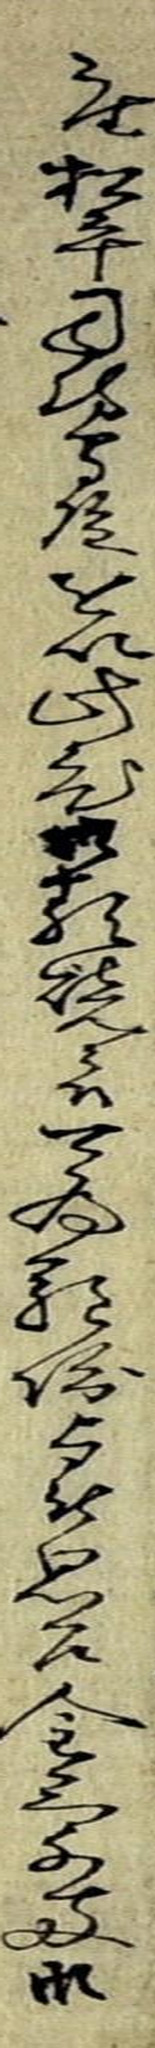座松平周防守殿を以此度御類焼ニ付可為難儀与被思召金三千両御
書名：命令之部 五
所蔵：福井県文書館 Fukui Prefectural Archives
